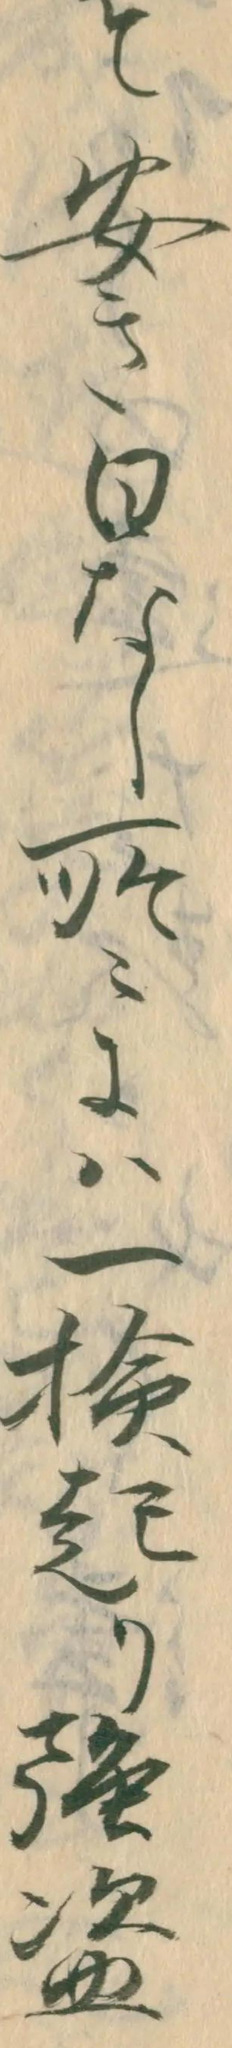も安き日なし所々には一検起り強盗

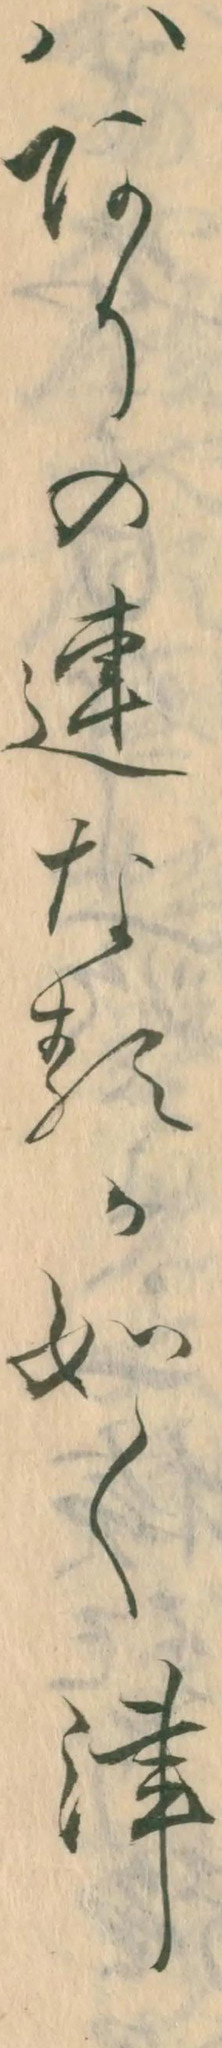はありの連なるか如く津々
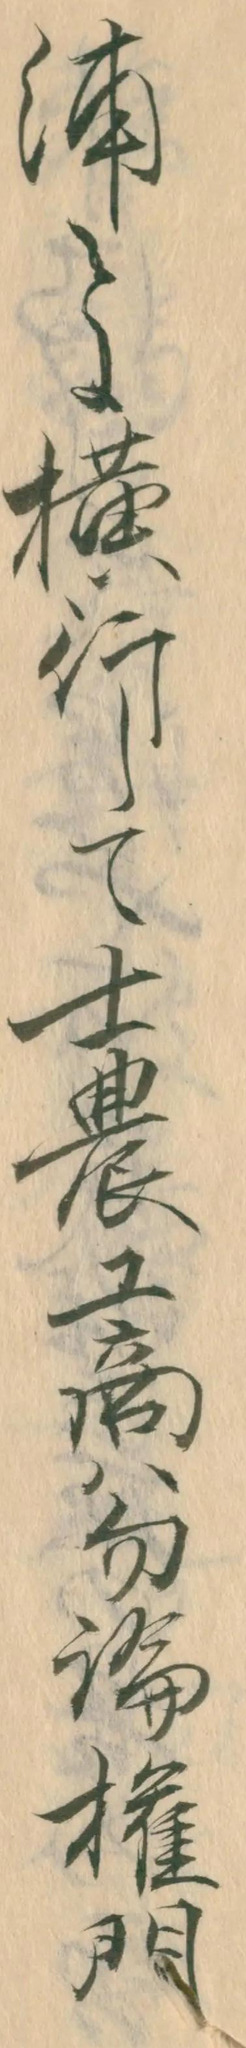浦々に横行して士農工商は勿論権門
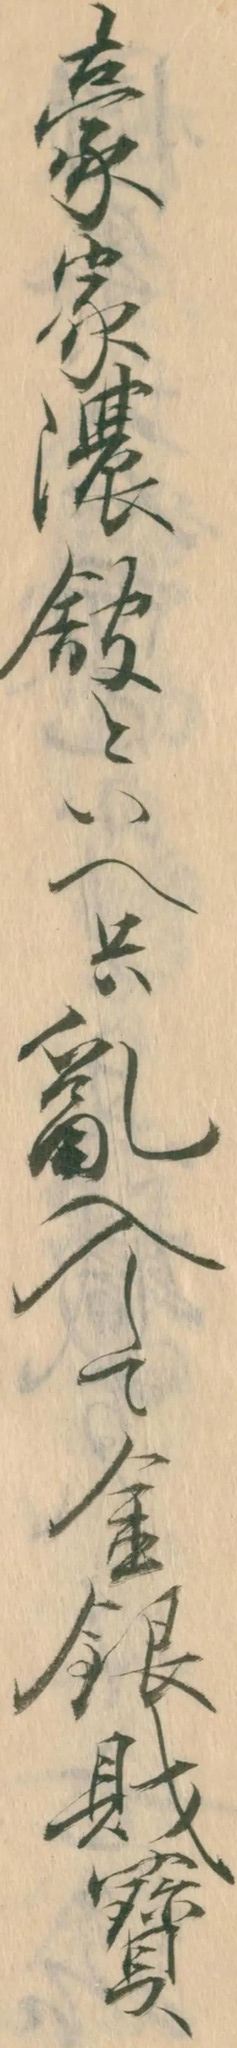豪家濃館といへ共乱入して金銀財宝
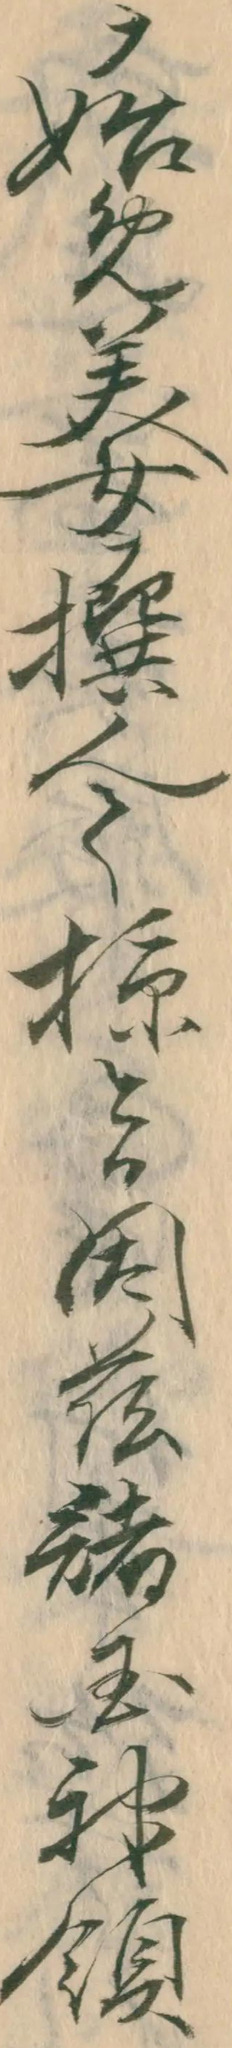を始め美女を撰んて掠とる因茲諸国神領
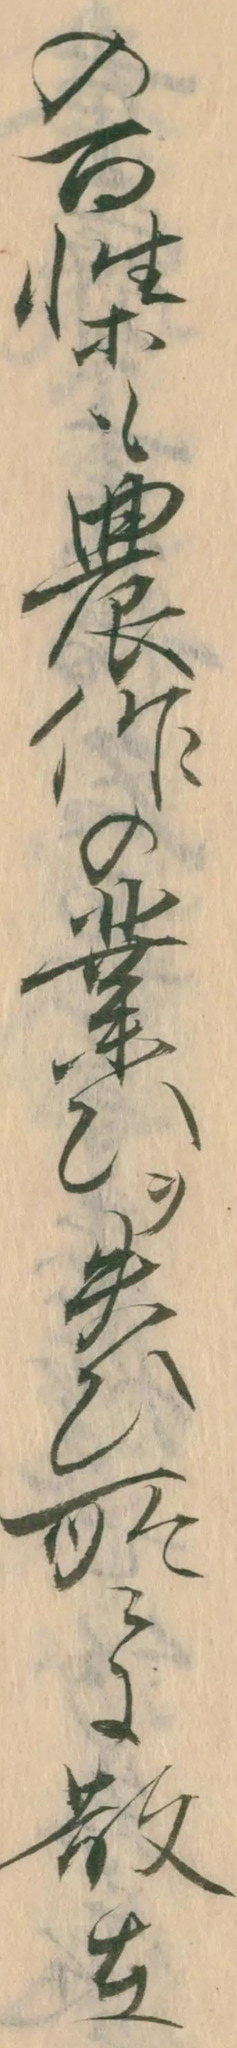の百性等も農作の業ひを失ひ所々に散在
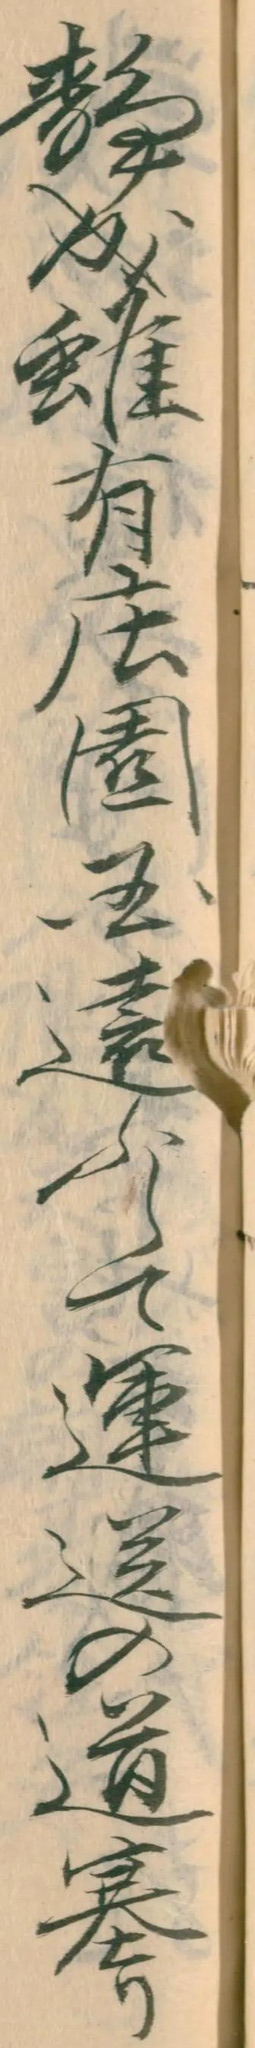静成雖有庄園国遠ふして運送の道塞り
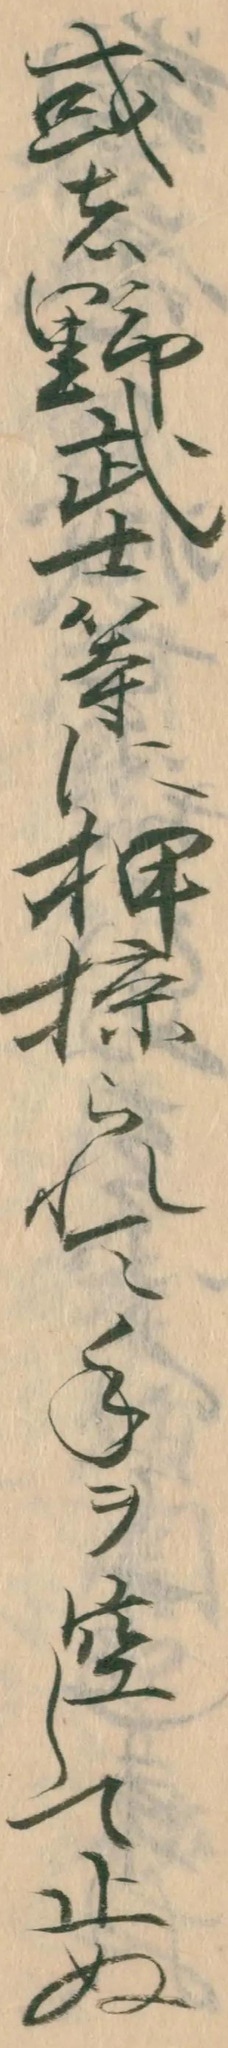或は野武士等に押掠られて手を空して止ぬ
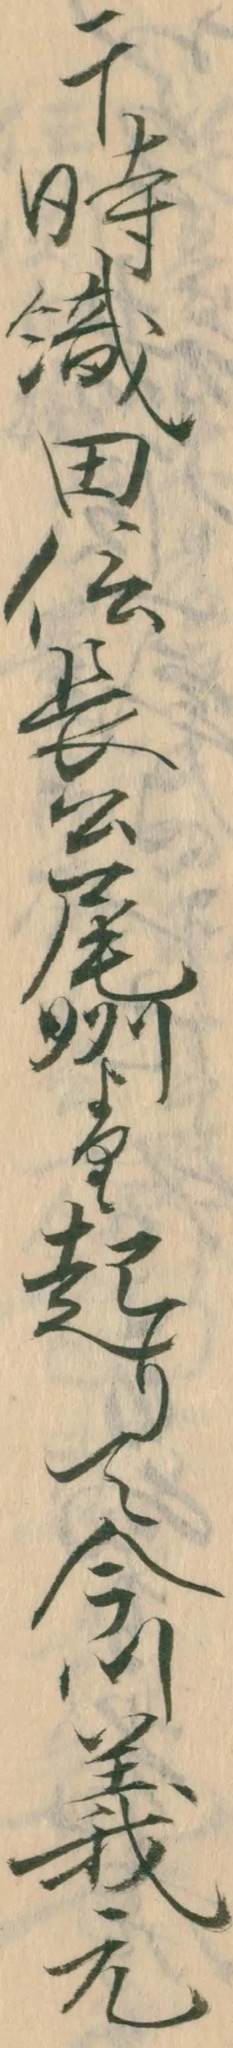于時織田信長公尾州より起りて今川義元
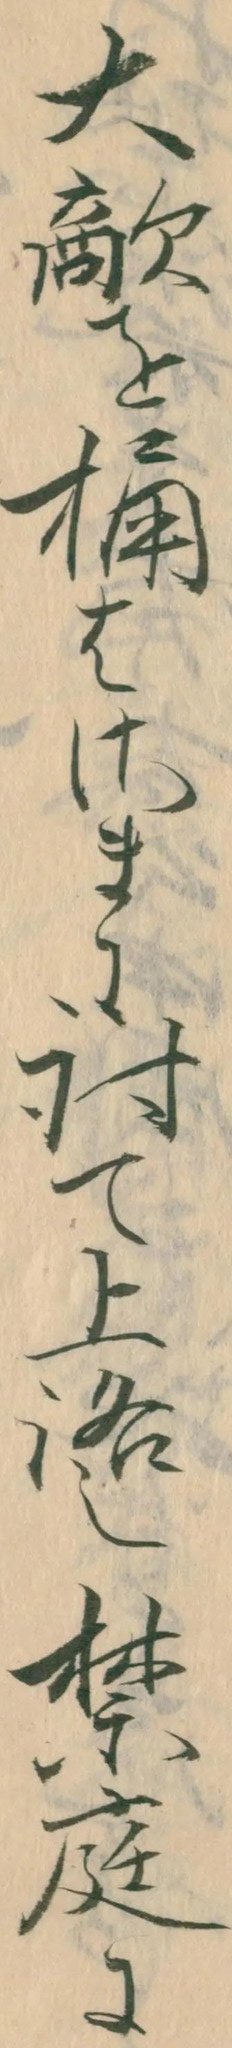大敵を桶はさまに討て上洛し禁庭に
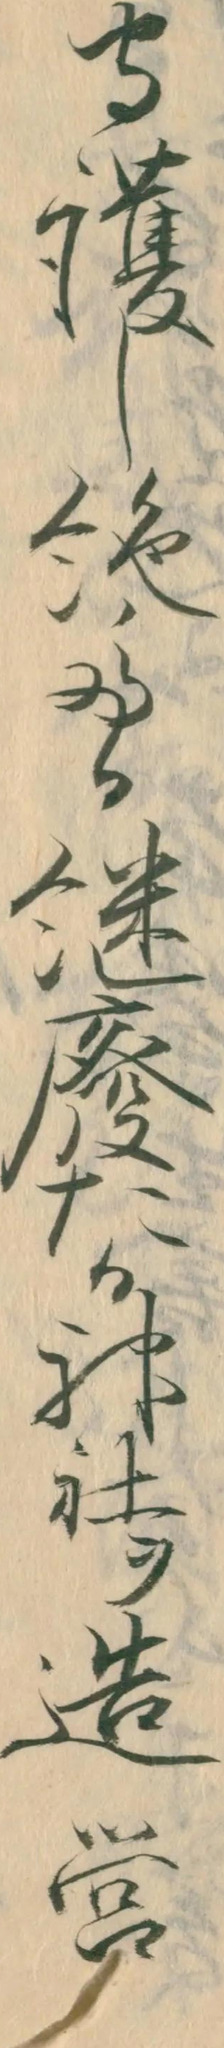守護し絶たる継廃たる神社を造営
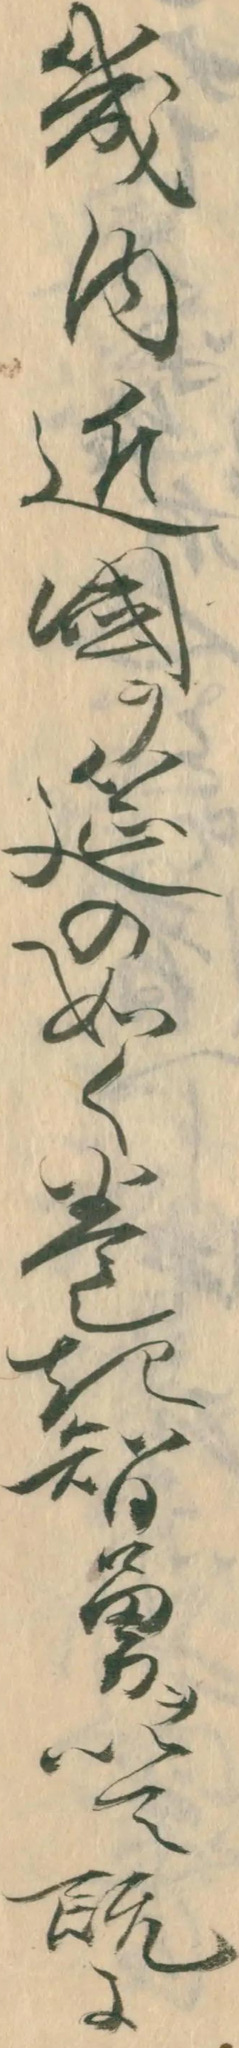畿内近国を筵の如く巻き智勇を以て既に

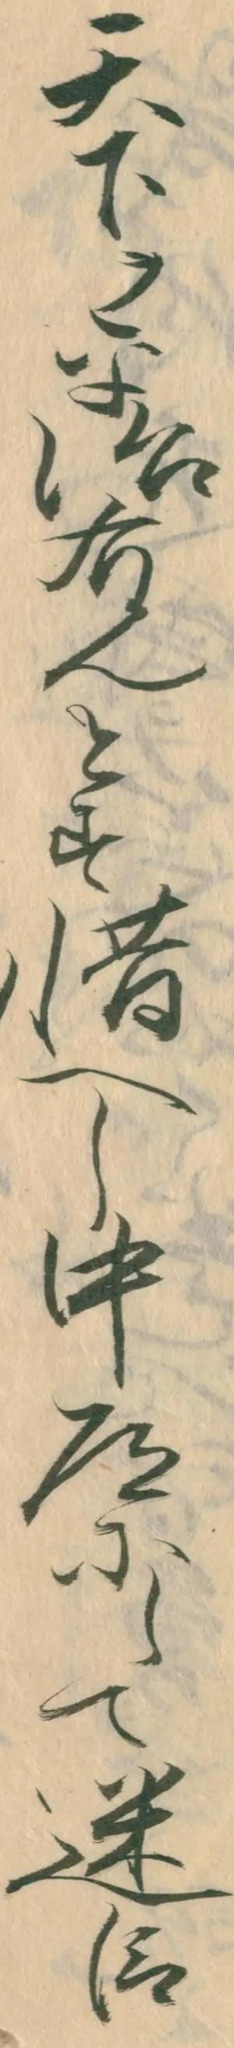天下を平治有んとす惜へし中道にして迷臣
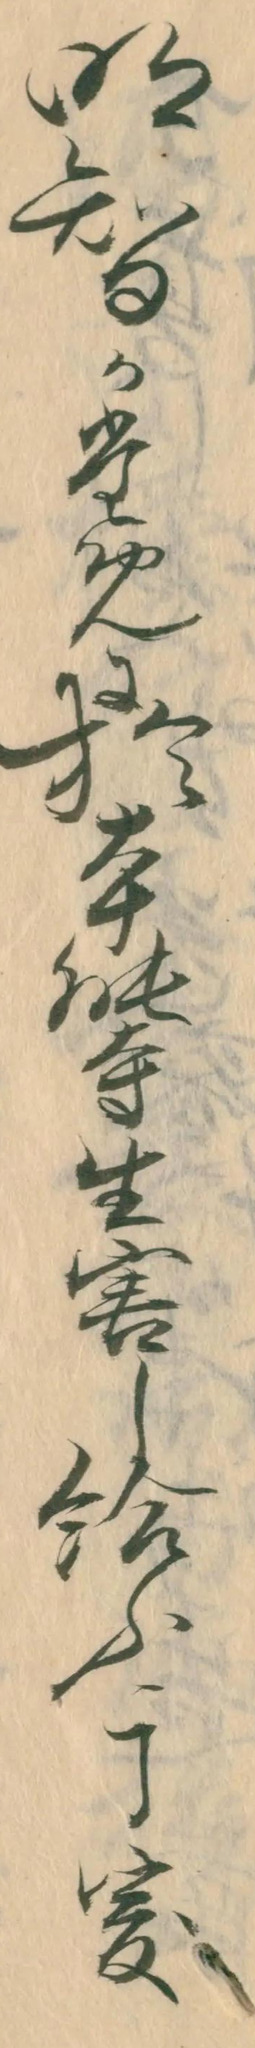明智かために於本能寺生害し給ふ于爰
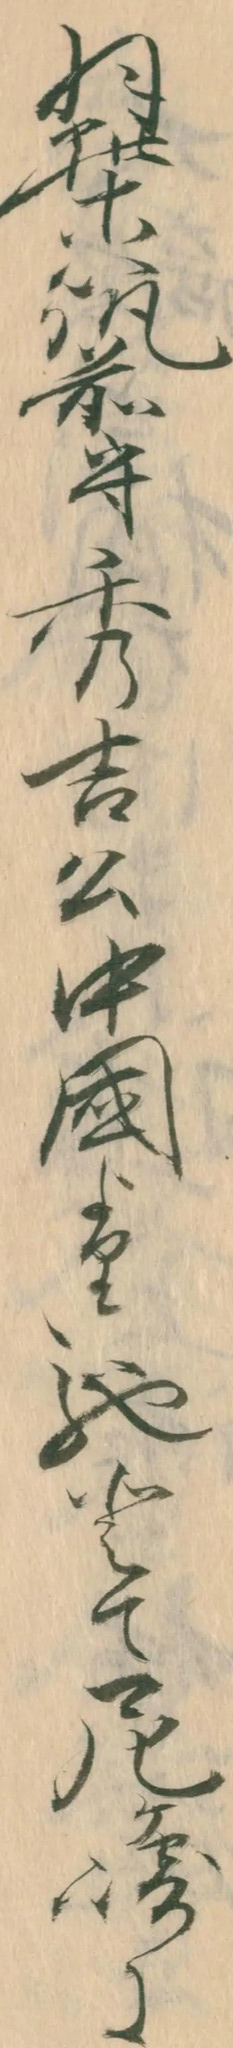羽柴筑前守秀吉公中国より馳登て尼ヶ崎に
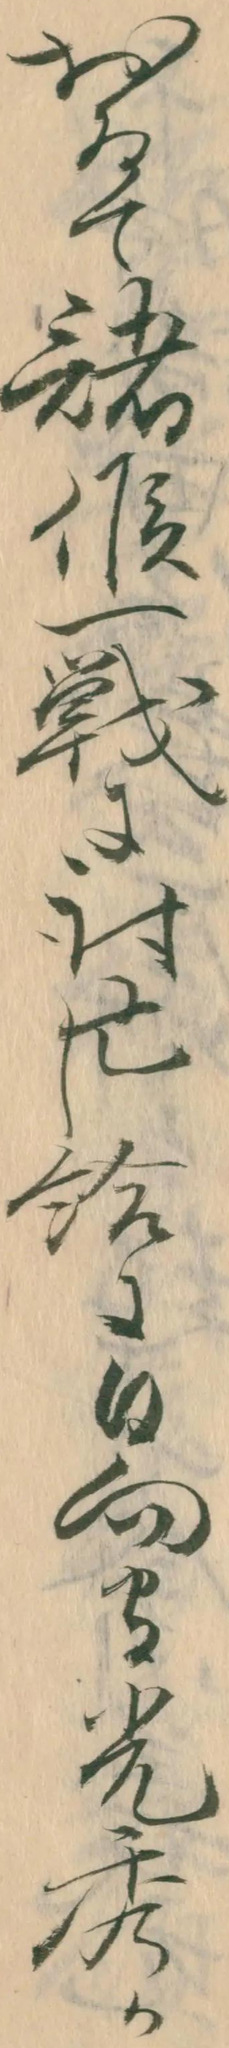おゐて諸候一戦に討亡し給に日向守光秀か
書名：賀茂社記録. 第12冊
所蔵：国立国会図書館 National Diet Library, JAPAN
